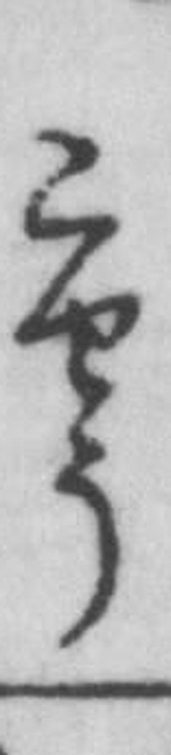こせう
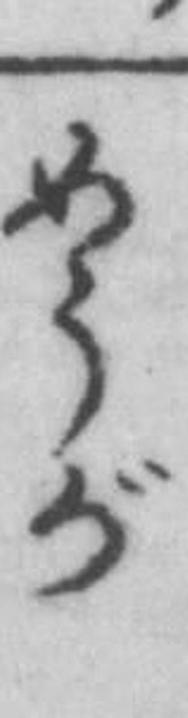めうが
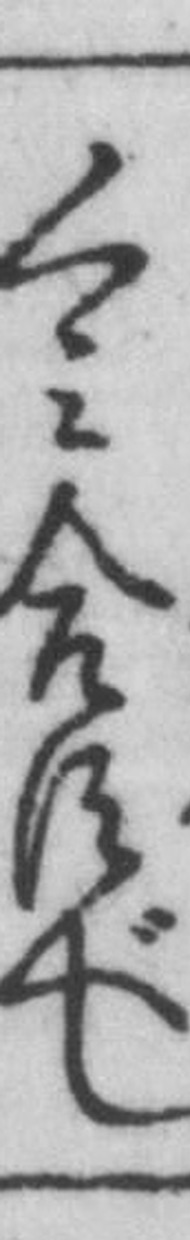くみ合すべし
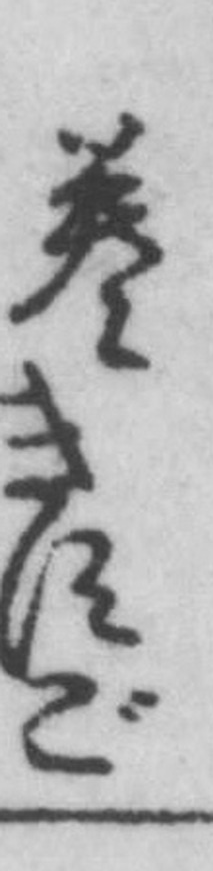巻きすご
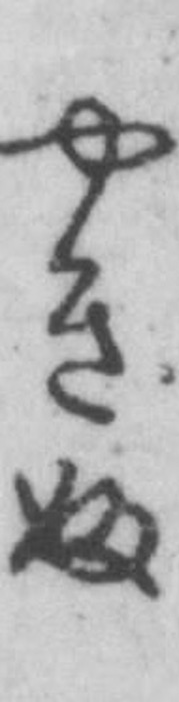やきふ
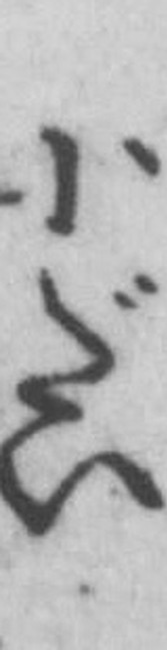小だい
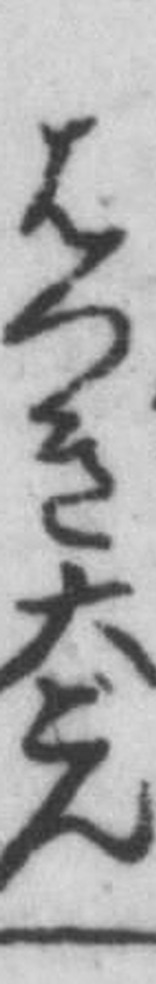はつき大こん
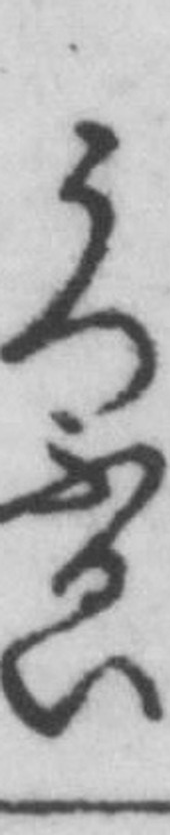うつふるい
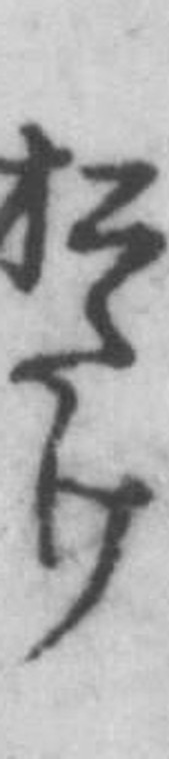松たけ
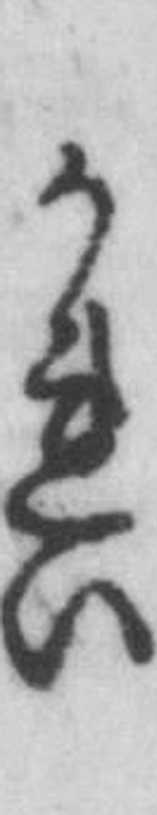かれい
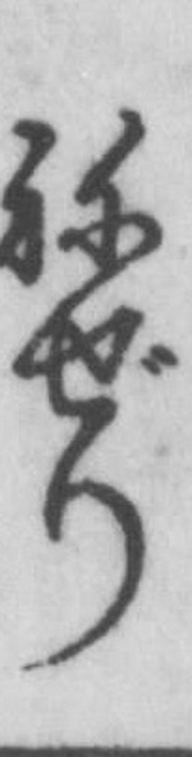ねぜり
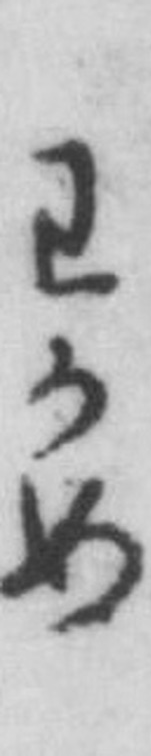わかめ
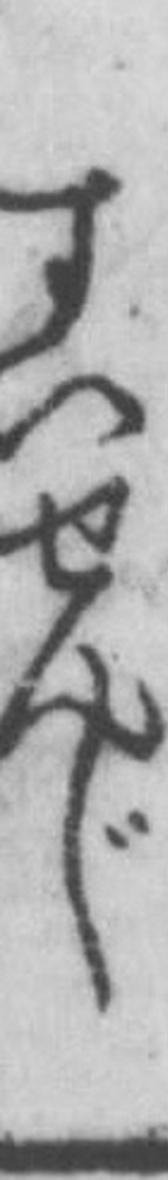すいせんじ
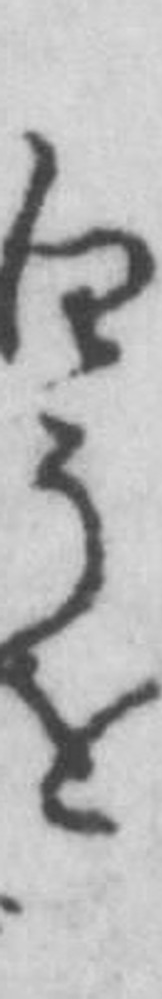白うを
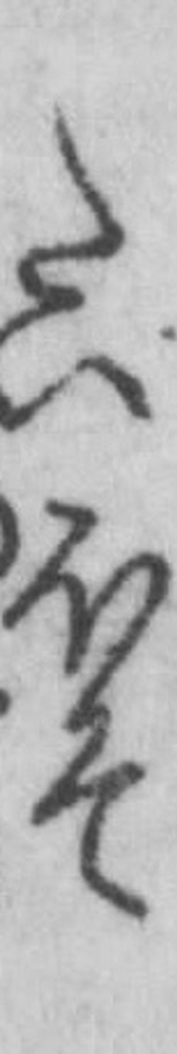たいほそ
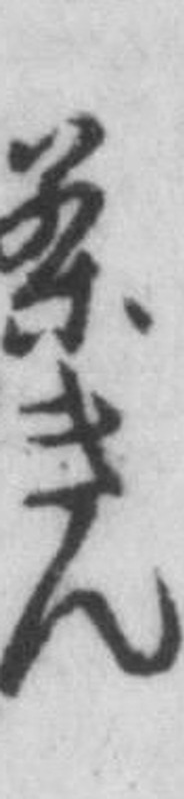茶きん
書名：料理献立抄
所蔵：大阪府立大学学術情報センター 国文学研究資料館
